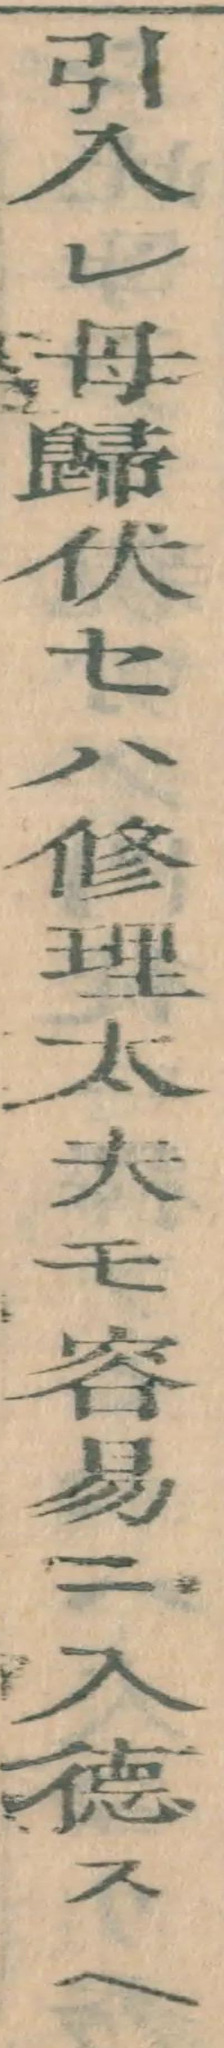引入レ母帰伏セハ修理太夫モ容易ニ入徳スヘ

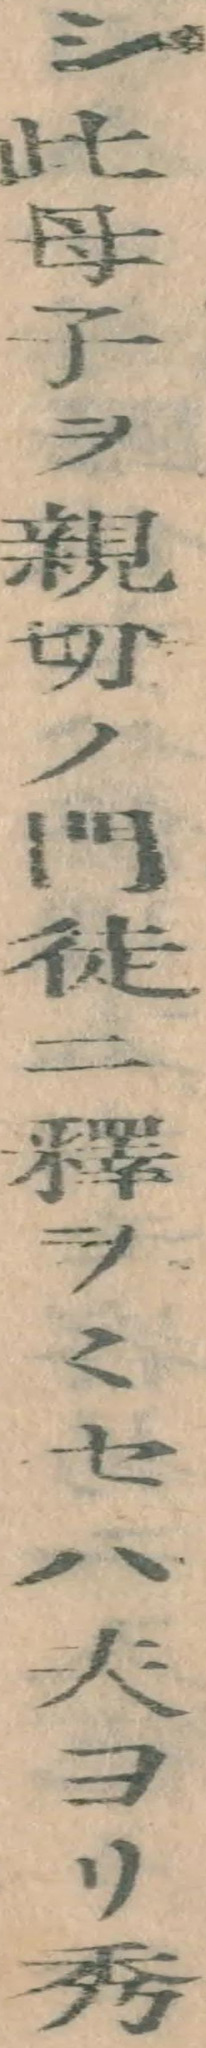シ此母子ヲ親切ノ門徒ニ釈ヲ〱セハ夫ヨリ秀
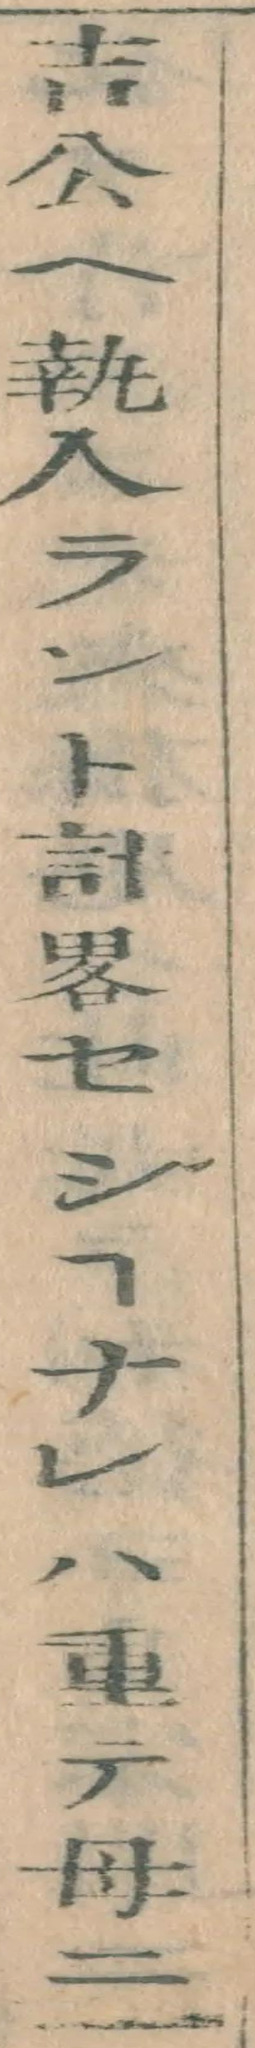吉公ヘ執入ラント計略セシヿナレハ重テ母ニ
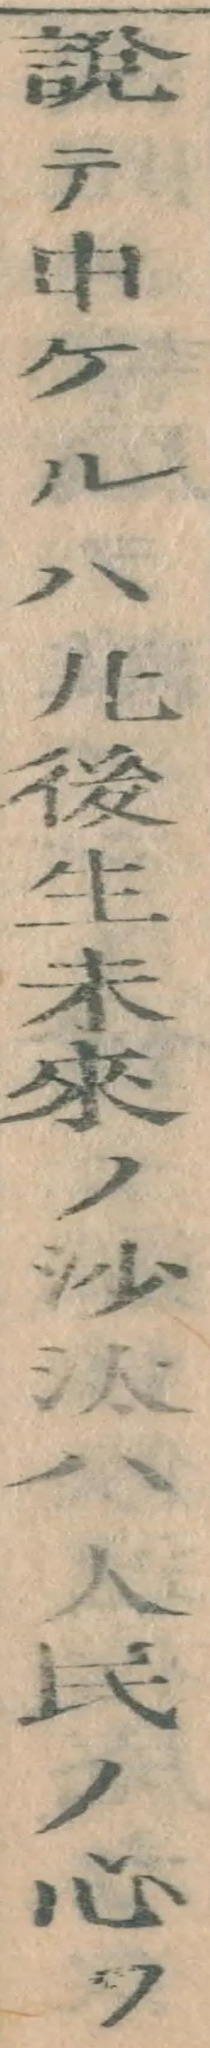説テ申ケルハ凡後生未来ノ沙汰ハ人民ノ心ノ
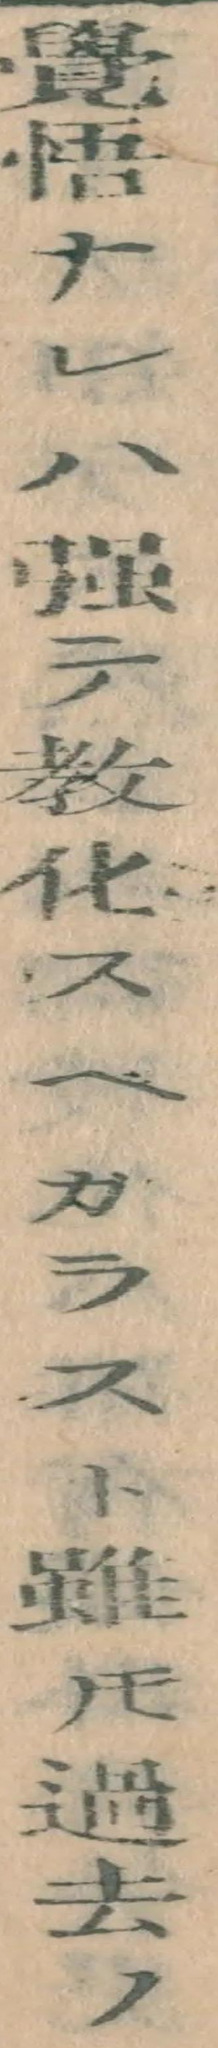覚悟ナレハ強テ教化スヘカラスト雖トモ過去ノ
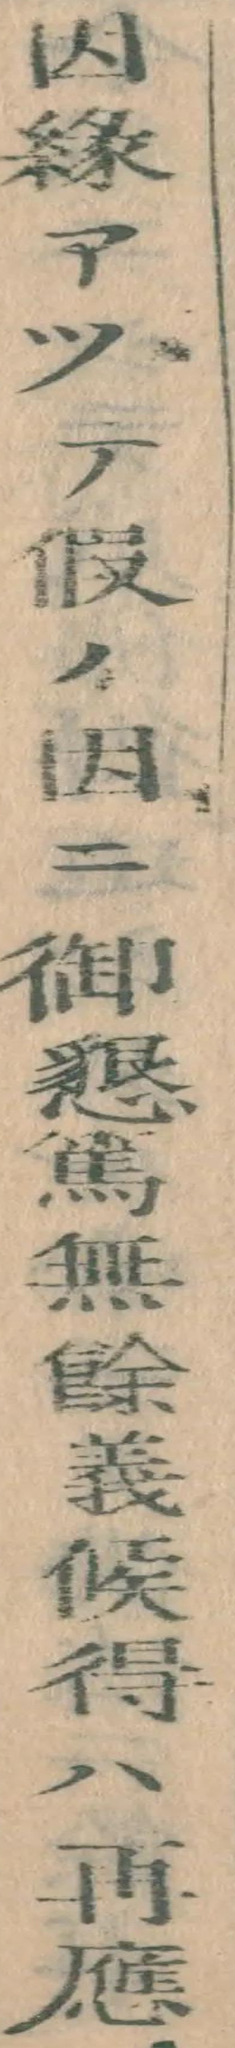因縁アツテ仮ノ因ニ御懇篤無余義候得ハ再応
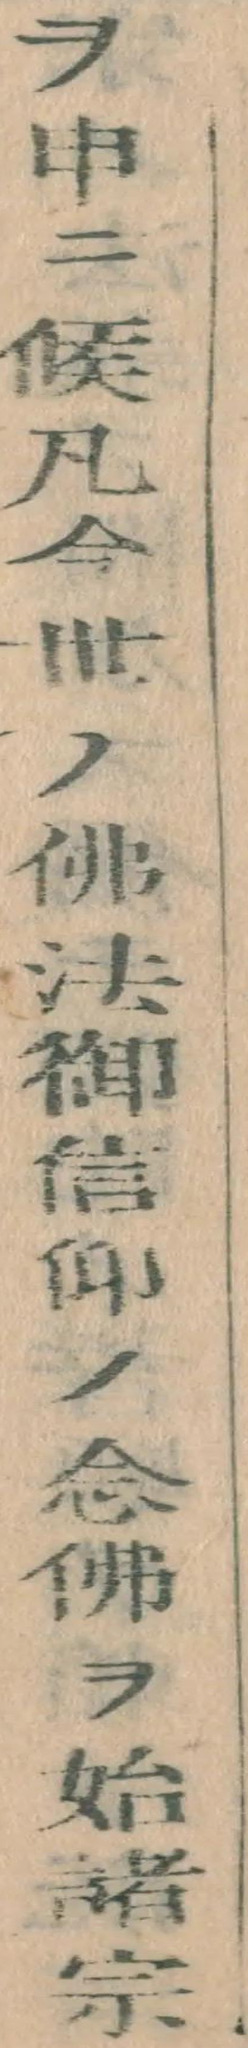ヲ申ニ候凡今世ノ仏法御信仰ノ念仏ヲ始諸宗
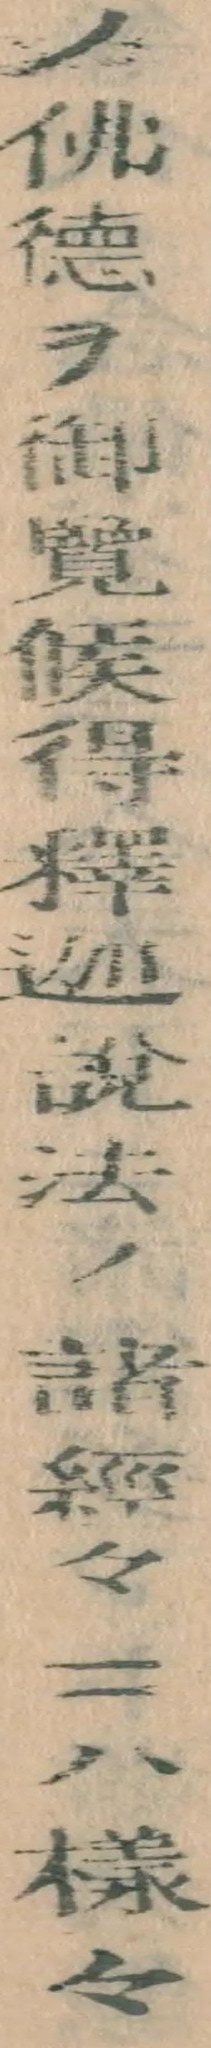ノ仏徳ヲ御覧候得釈迦説法ノ諸経々ニハ様々
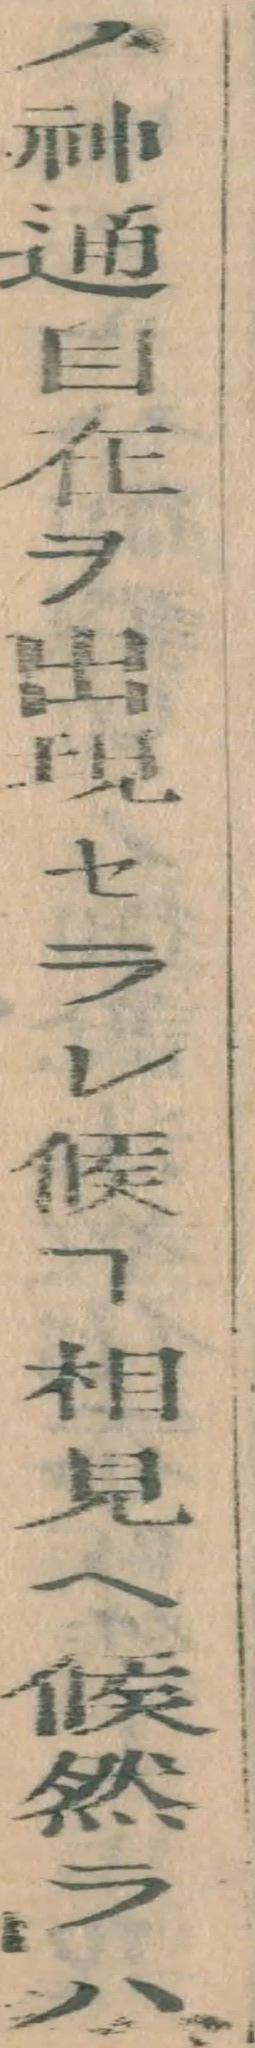ノ神通自在ヲ出現セラレ候ヿ相見ヘ候然ラハ
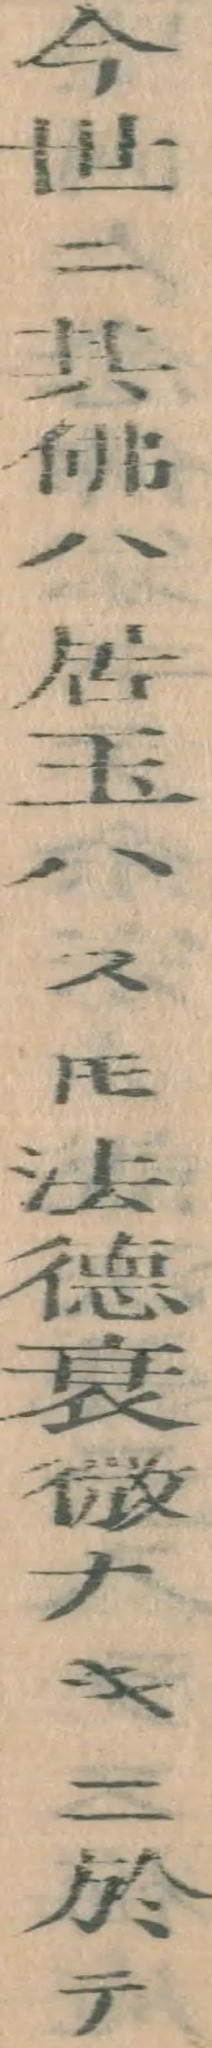今世ニ其仏ハ居玉ハストモ法徳衰微ナキニ於テ
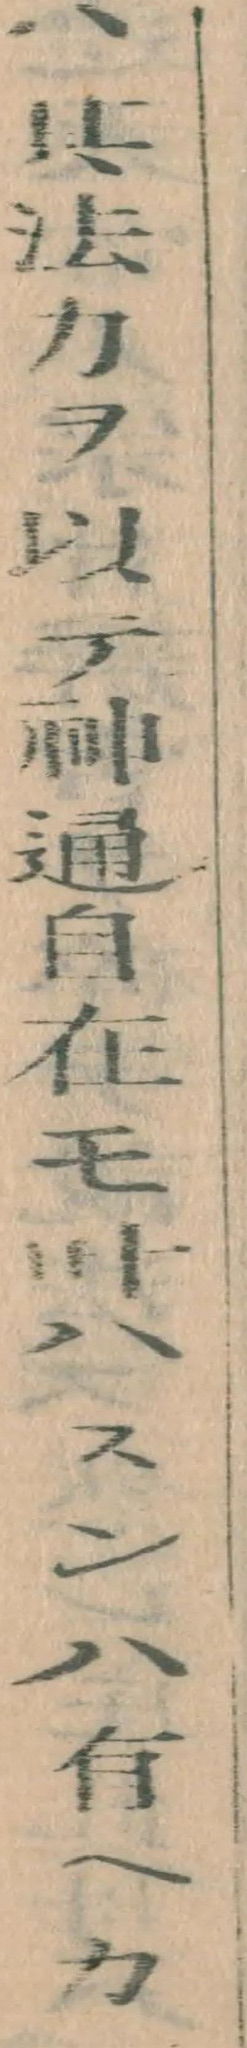ハ其法力ヲ以テ神通自在モ叶ハスンハ有ヘカ
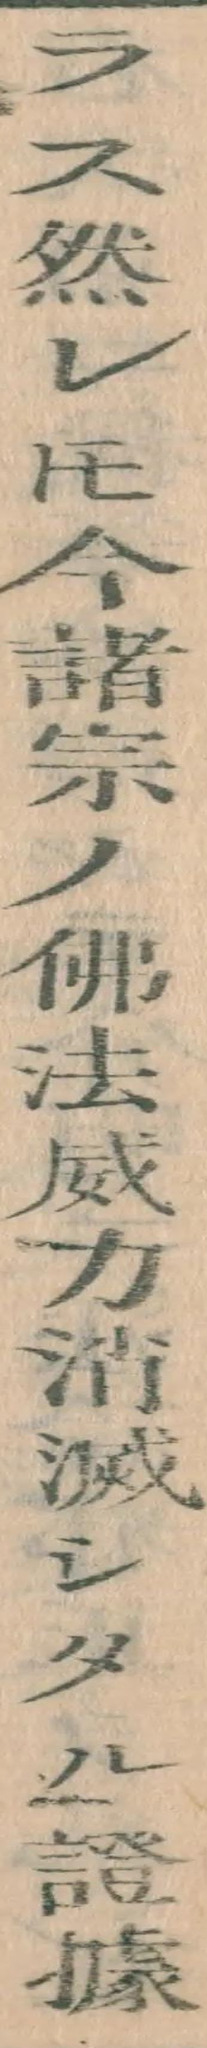ラス然レトモ今諸宗ノ仏法威力消滅シタル証拠
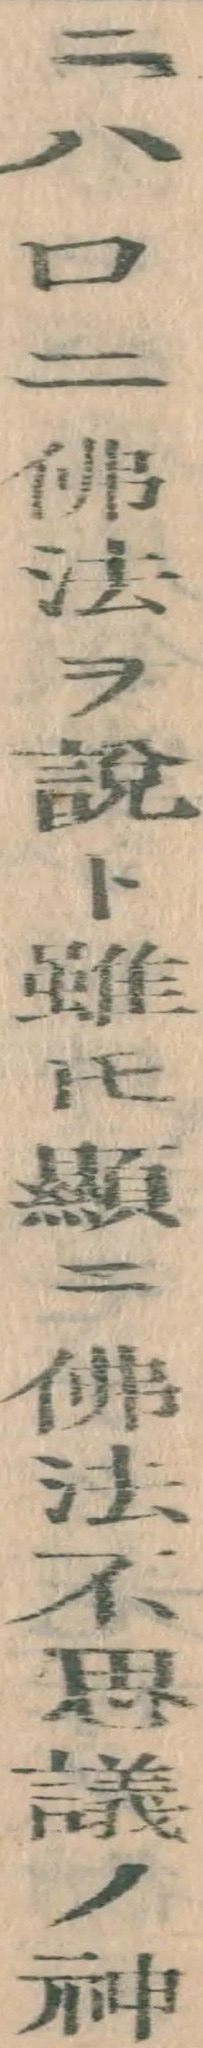ニハ口ニ仏法ヲ説ト雖トモ顕ニ仏法不思議ノ神
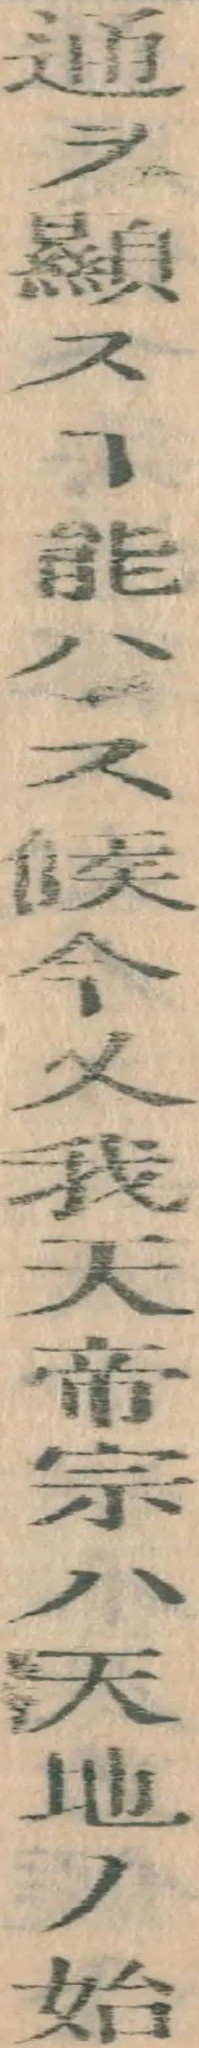通ヲ顕スヿ能ハス候今又我天帝宗ハ天地ノ始
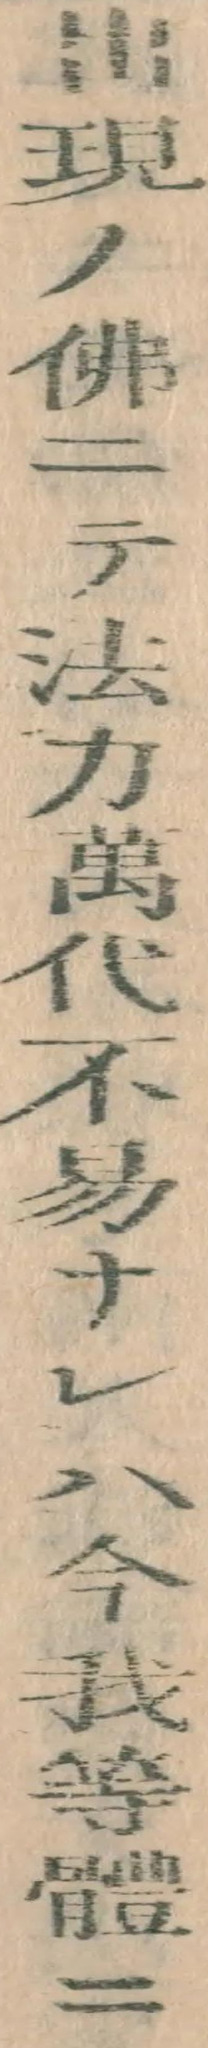出現ノ仏ニテ法力万代不易ナレハ今我等体ニ
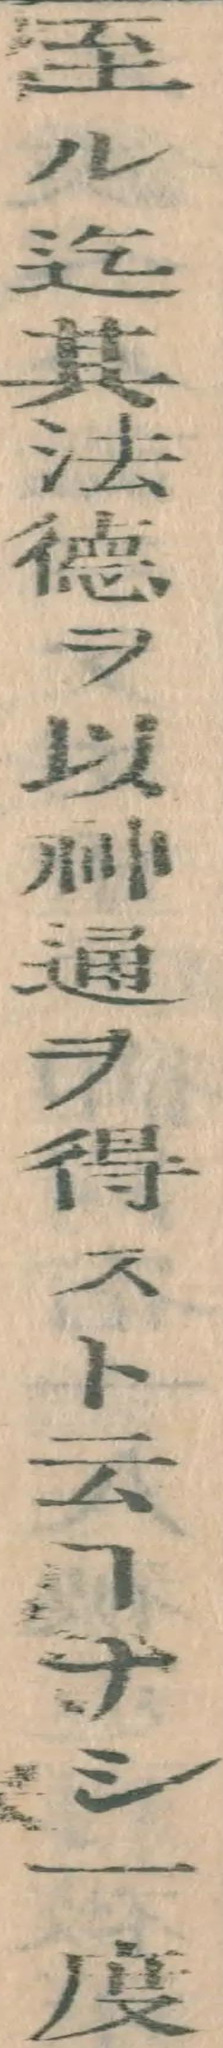至ル迄其法徳ヲ以神通ヲ得スト云ヿナシ一度
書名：南蛮寺興廃記
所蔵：国立国会図書館 National Diet Library, JAPAN
